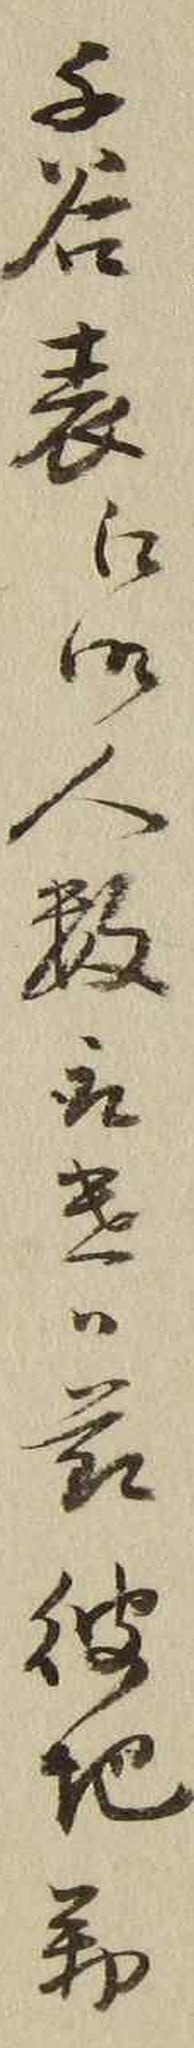千谷表江御人数取遣候節彼地勤
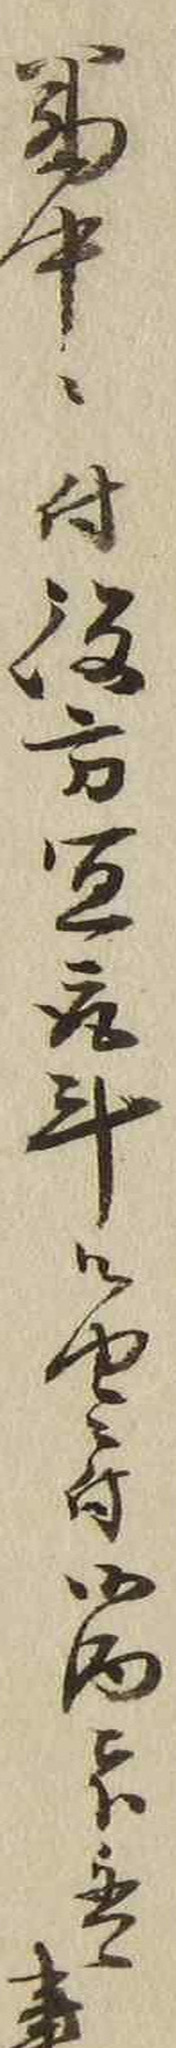番中ニ付役方宜取計候由ニ付御酒被下置候事
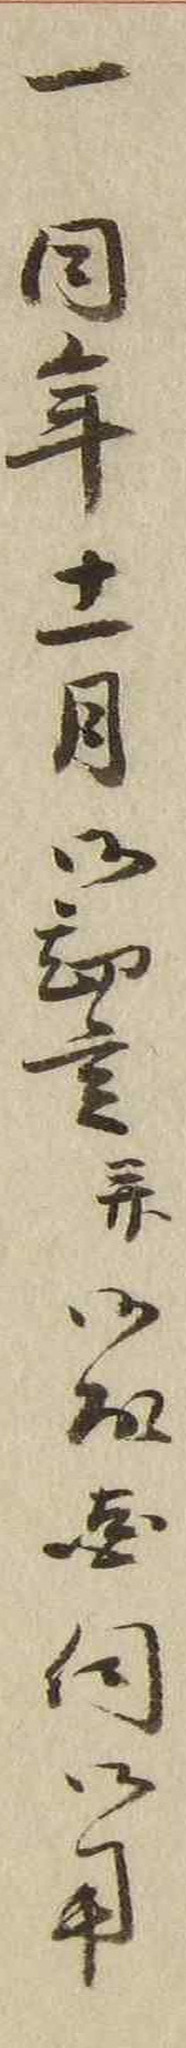一同年十一月御勘定并御取固伺御用

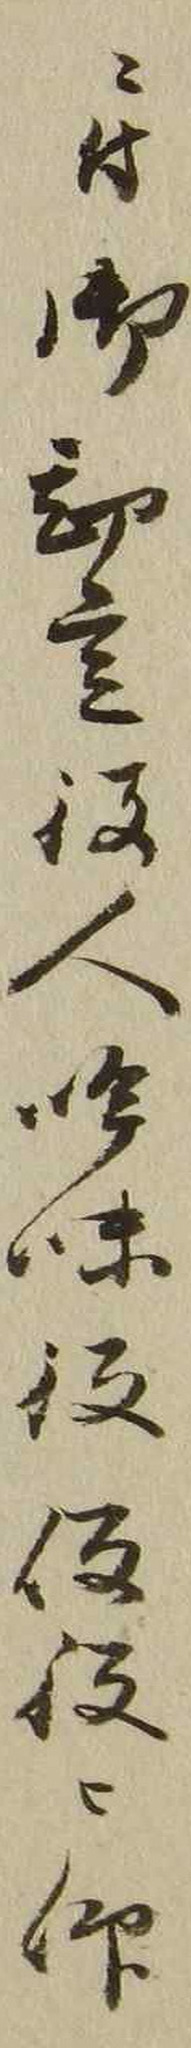ニ付御勘定役人吟味役仮役被仰
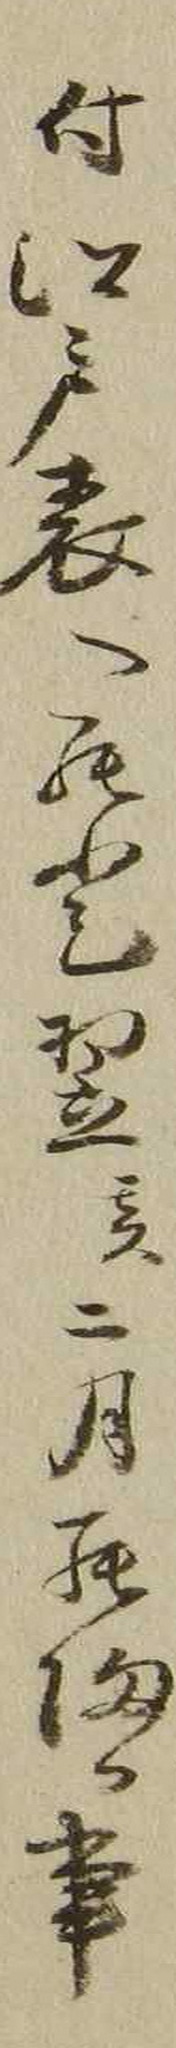付江戸表へ罷登翌亥二月罷帰候事
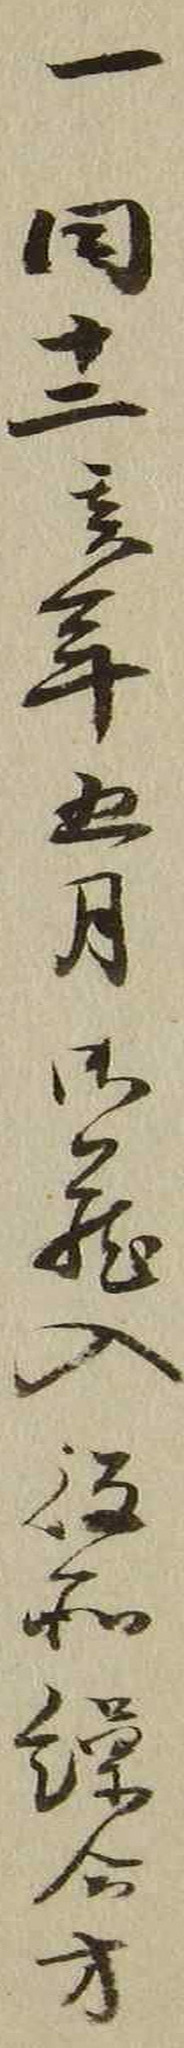一同十二亥年五月御蔵入役所繰合方
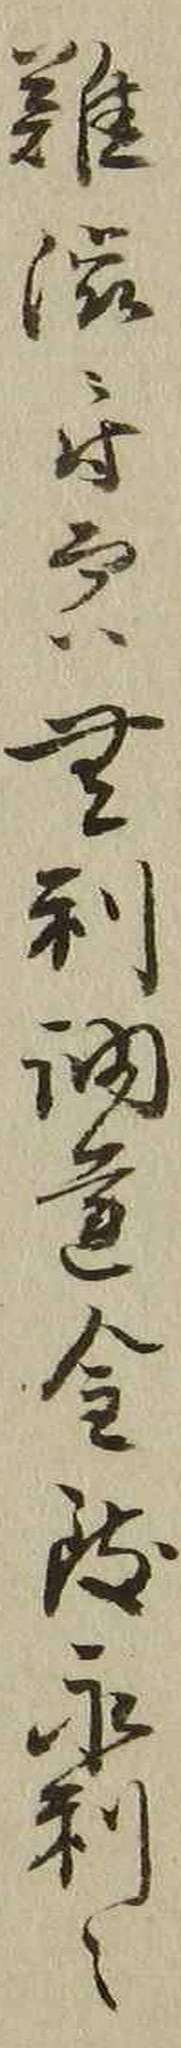難渋ニ付而ハ無利調達金致永利之
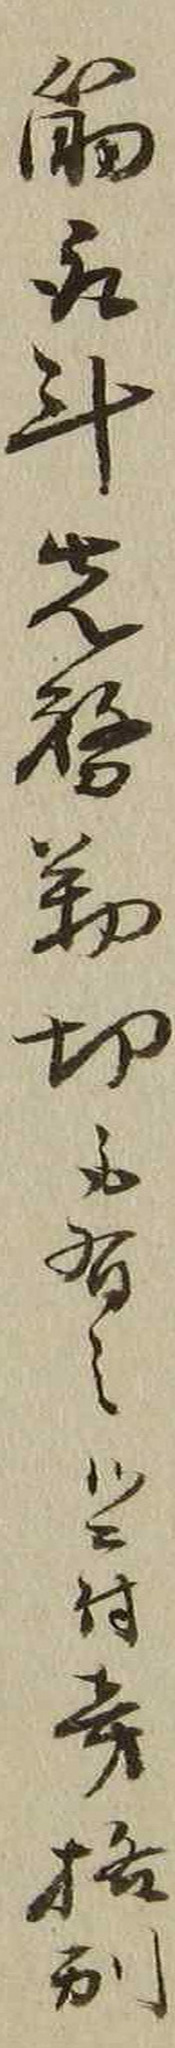筋取計先務勤切も有之候ニ付旁格別
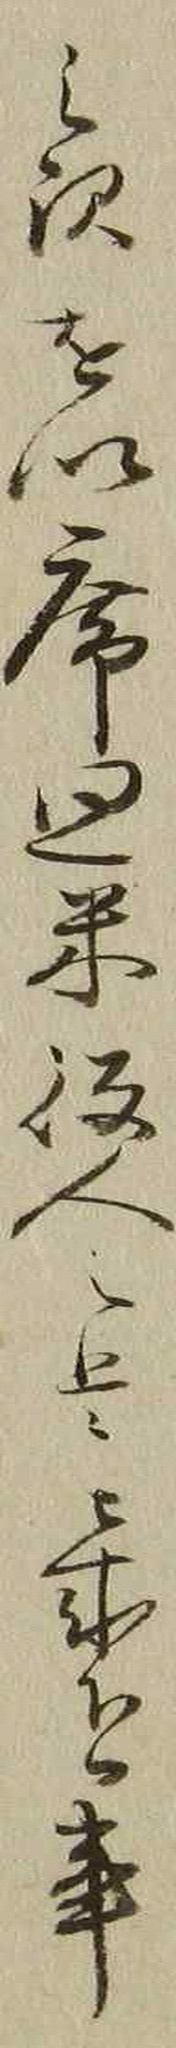之訳を以席廻米役人之上ニ被成下候事
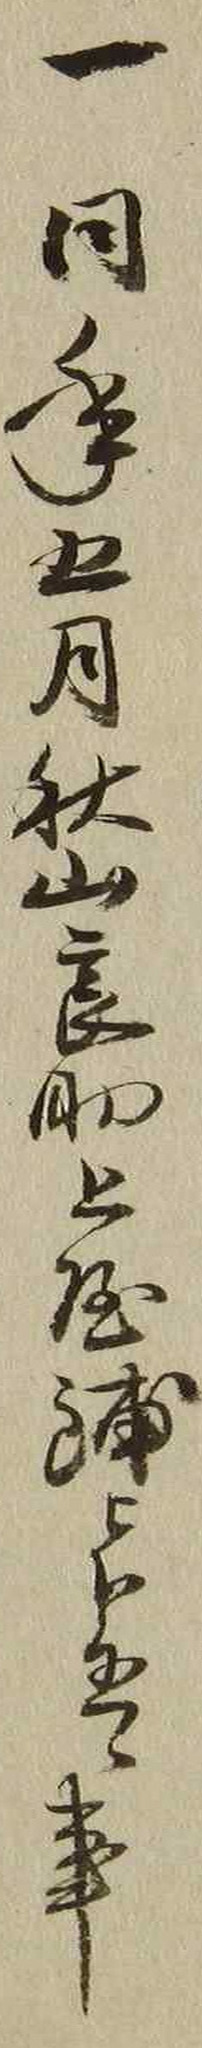一同年五月秋山良助上屋鋪被下置候事
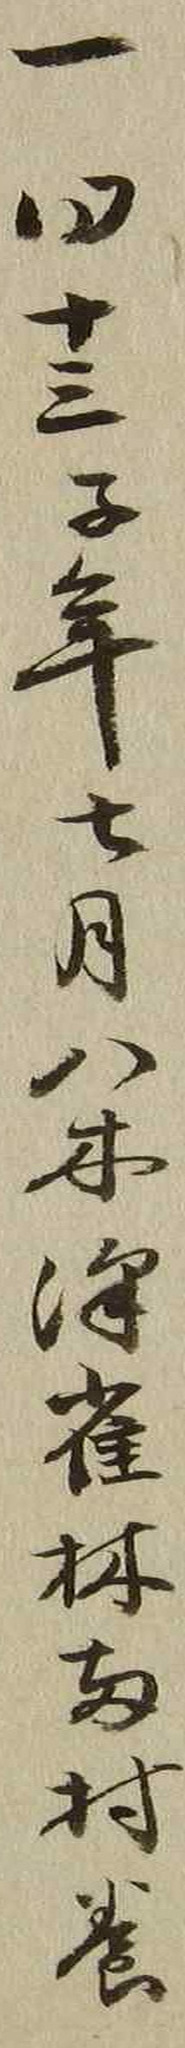一同十三子年七月八木沢雀林両村養
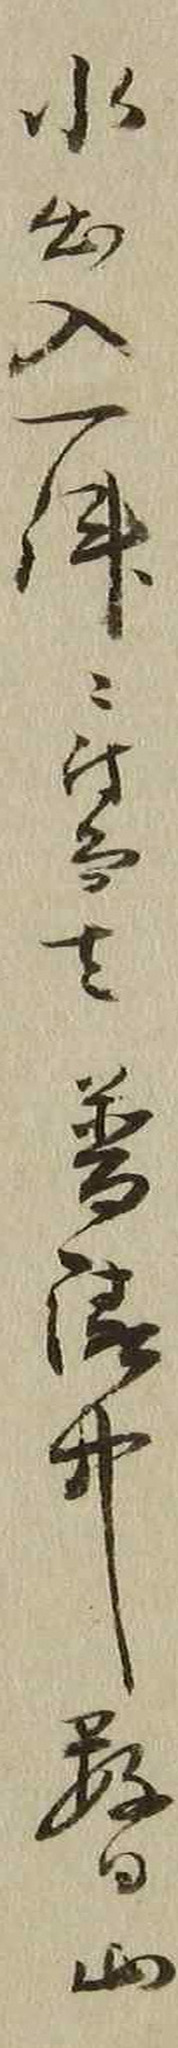水出入一件ニ付而は普請中数日山
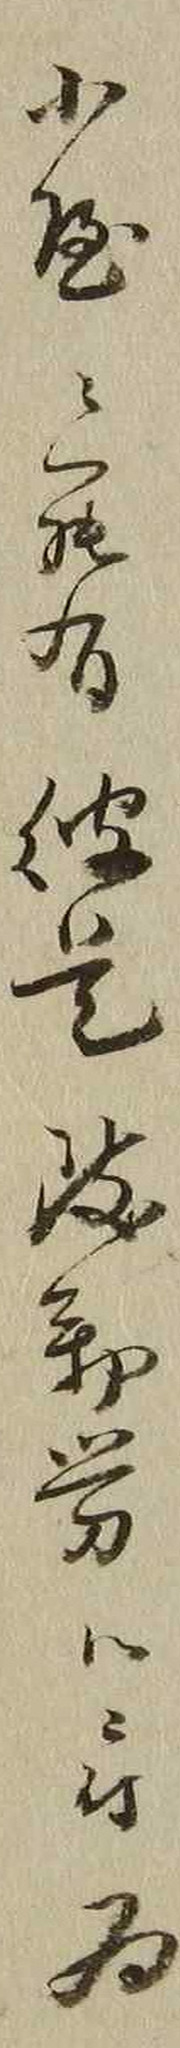小屋ニ罷有彼是致勤労候ニ付為
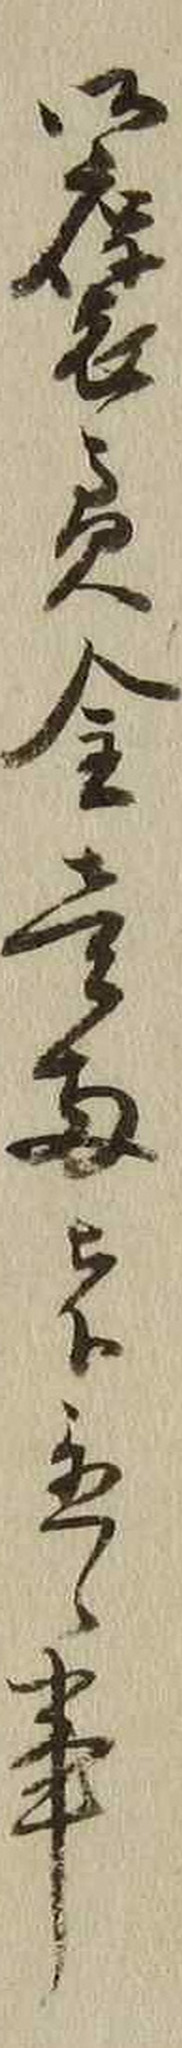御褒美金壱両被下置候事
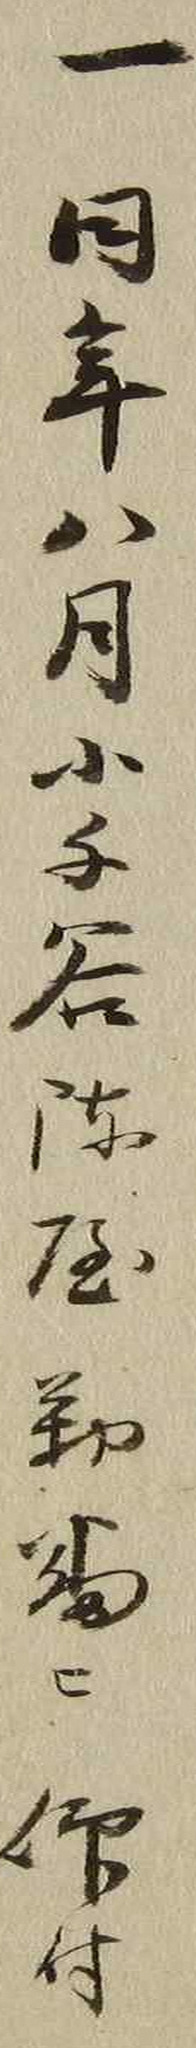一同年八月小千谷陣屋勤番被仰付
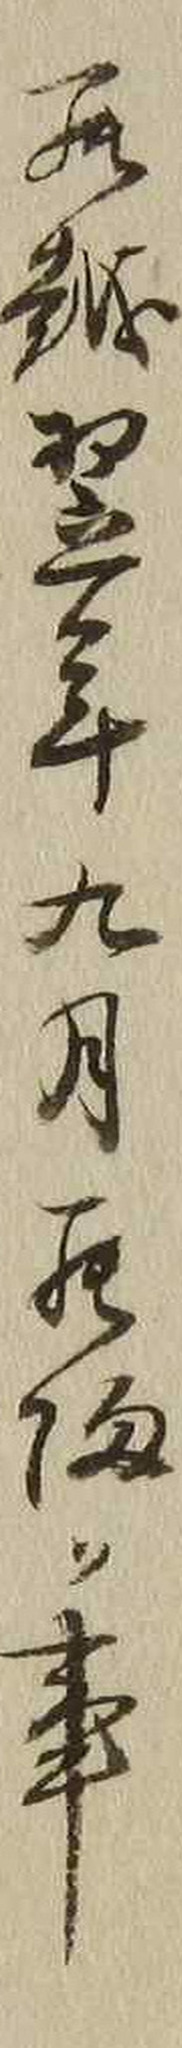罷越翌年九月罷帰候事
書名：諸士系譜　巻之236　ふ之部4
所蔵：会津若松市立会津図書館
